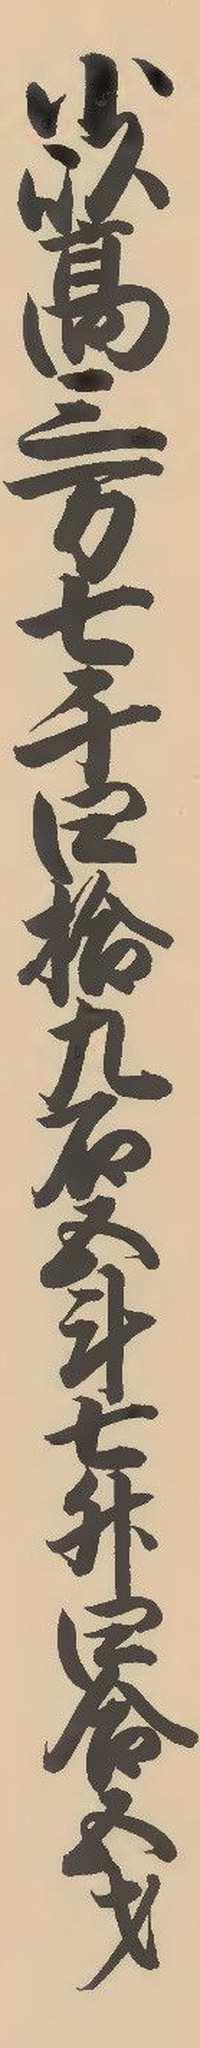小以髙三万七千四拾九石五斗七升四合五才
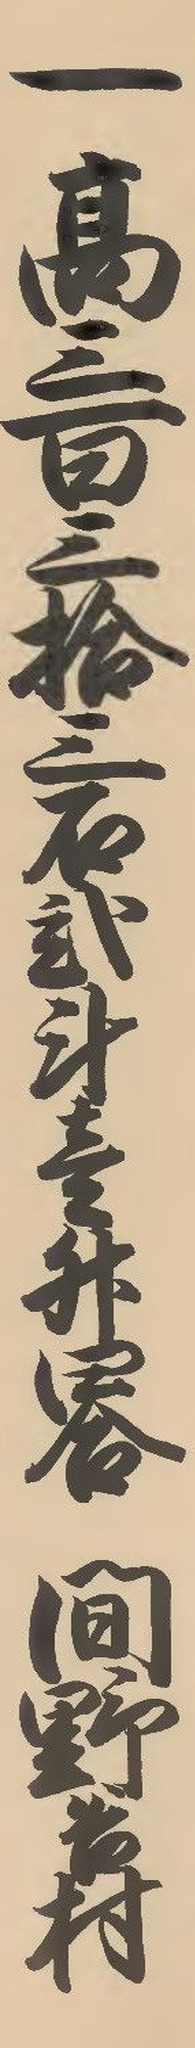一髙三百三拾三石弐斗壱升四合間野谷村
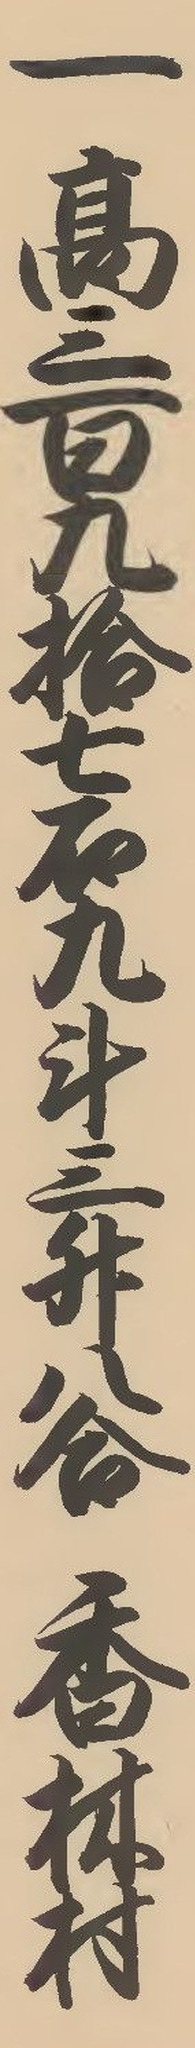一髙三百九拾七石九斗三升八合香林村
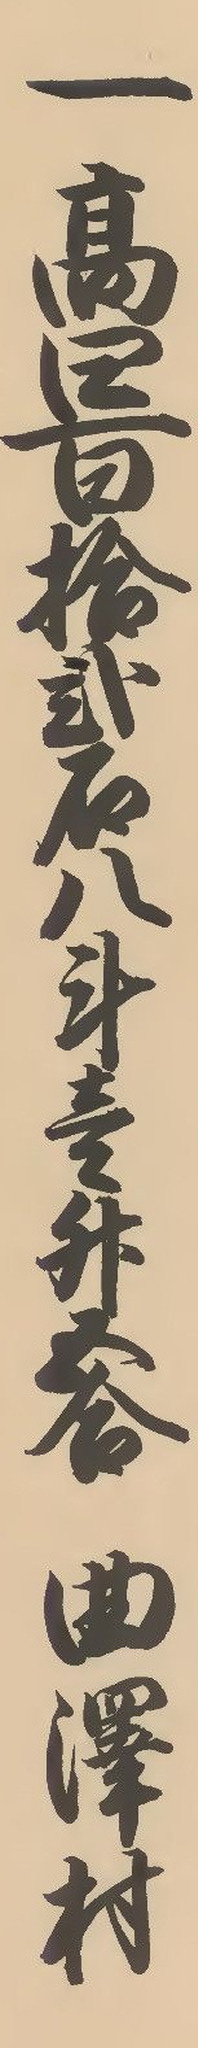一髙四百拾弐石八斗壱升五合曲澤村

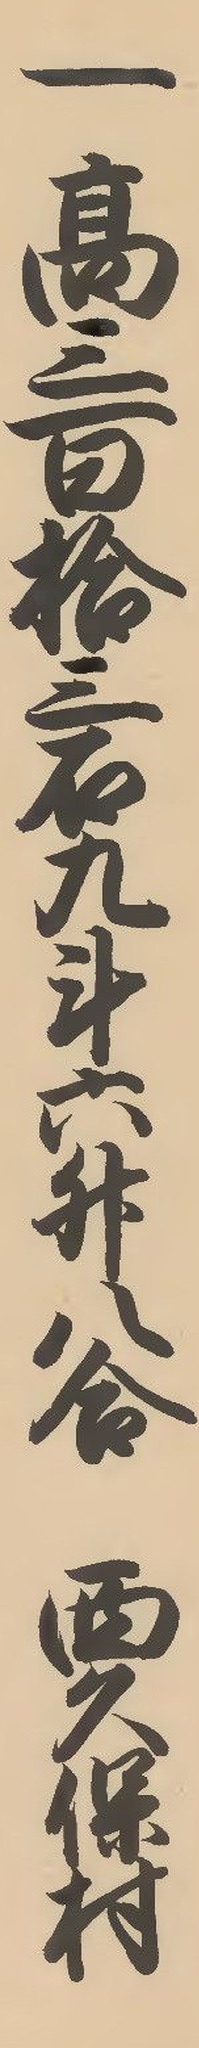一髙三百拾三石九斗六升八合西久保村
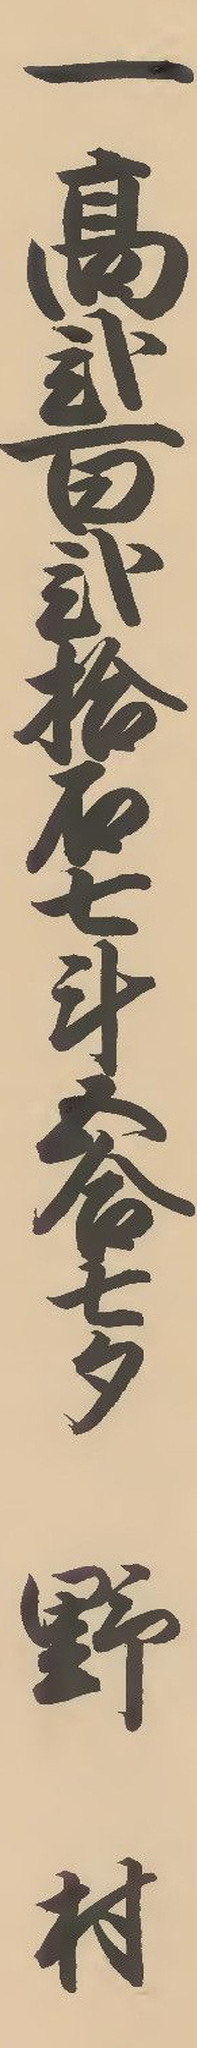一髙弐百弐拾石七斗五合七夕野村
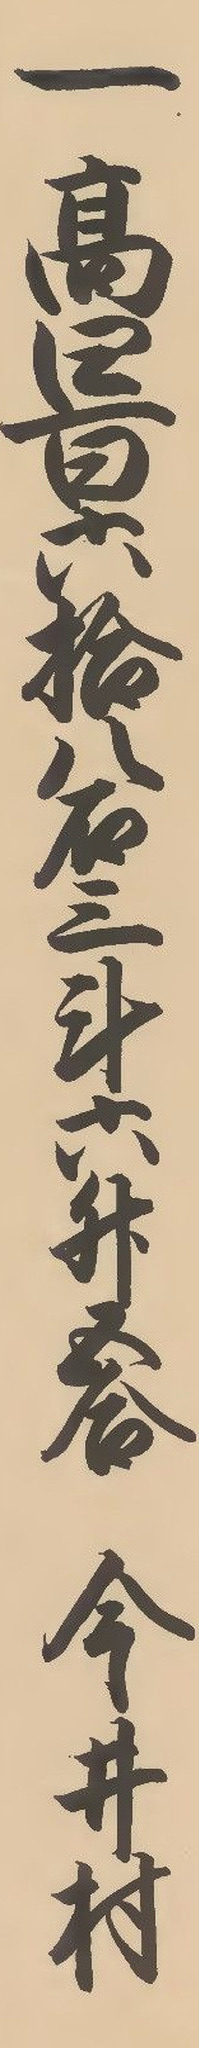一髙四百六拾八石三斗六升五合今井村
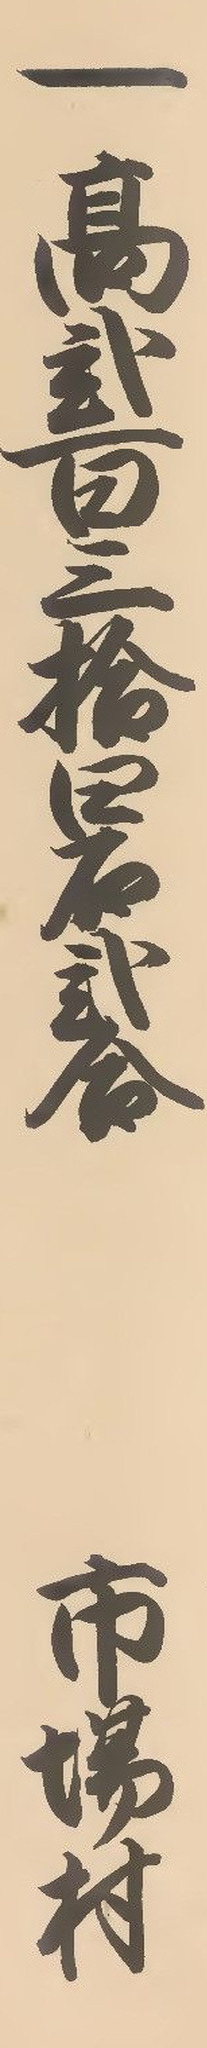一髙弐百三拾四石弐合市場村
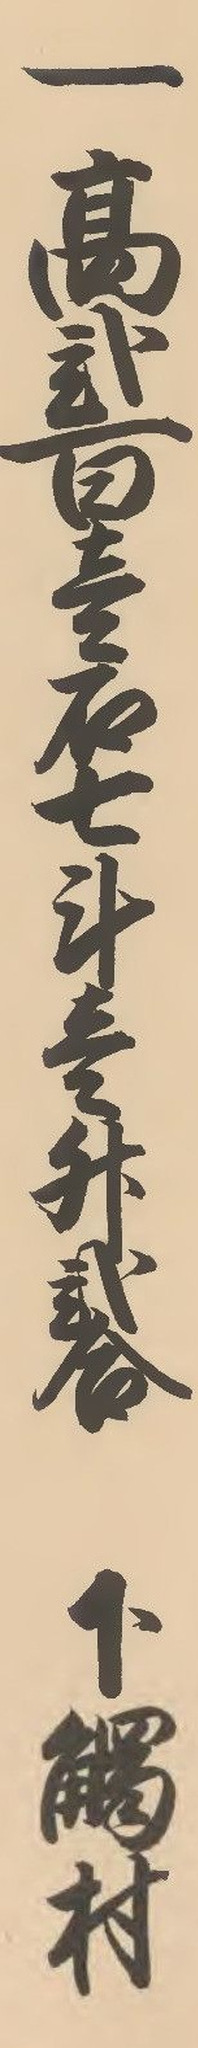一髙弐百壱石七斗壱升弐合下觸村
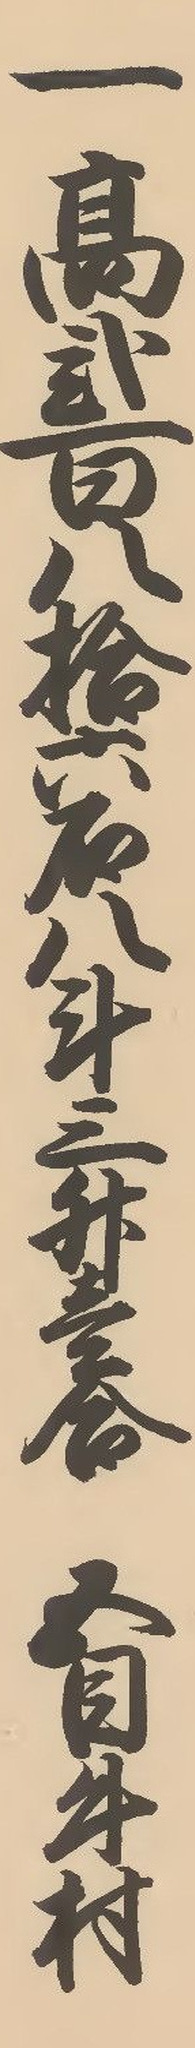一髙弐百八拾六石八斗三升壱合五目井村
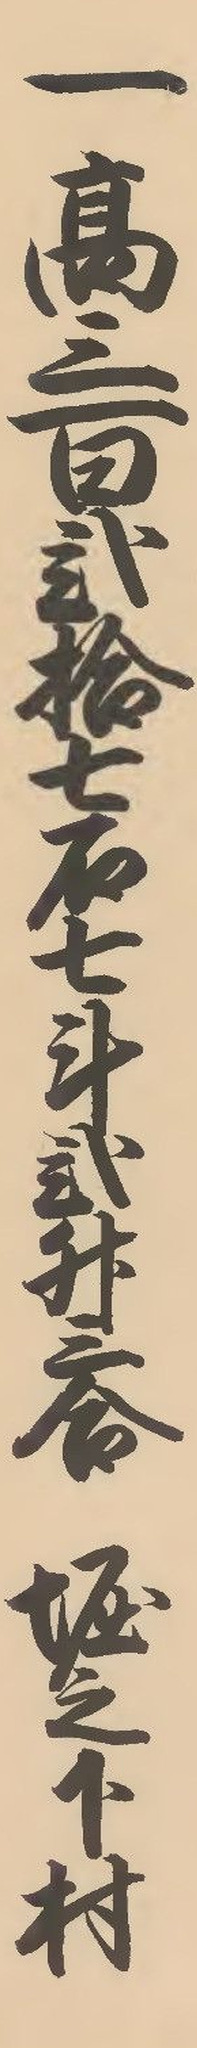一髙三百弐拾七石七斗弐升三合堀之下村

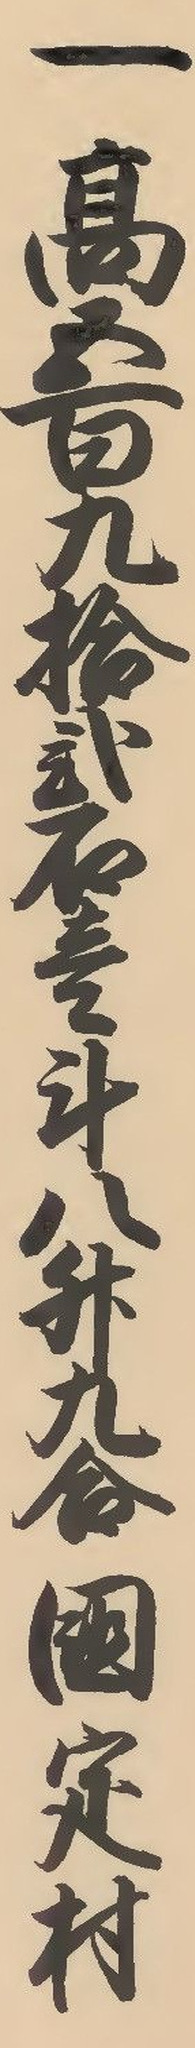一髙五百九拾弐石壱斗八升九合国定村
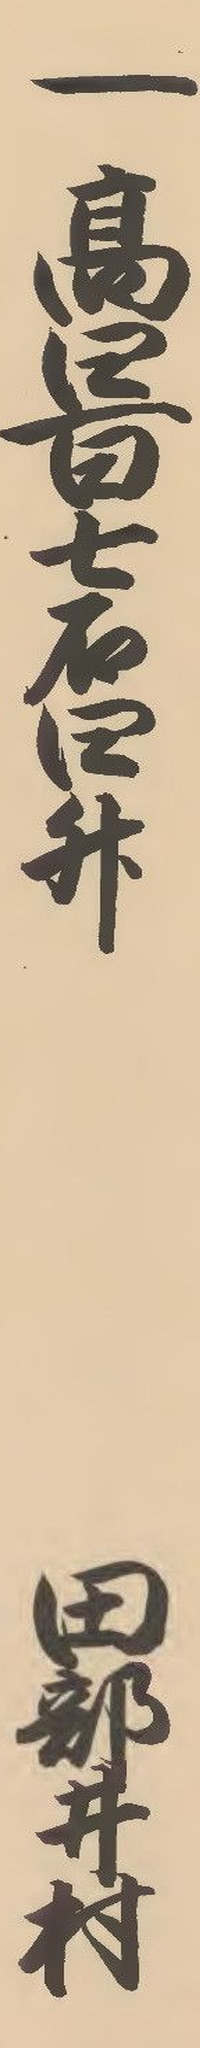一髙四百七石四升田部井村
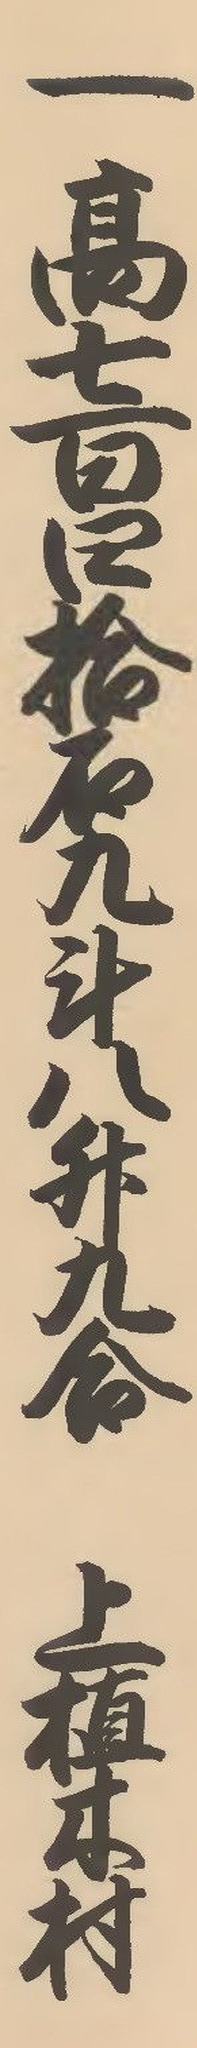一髙七百四拾石九斗八升九合上植木村
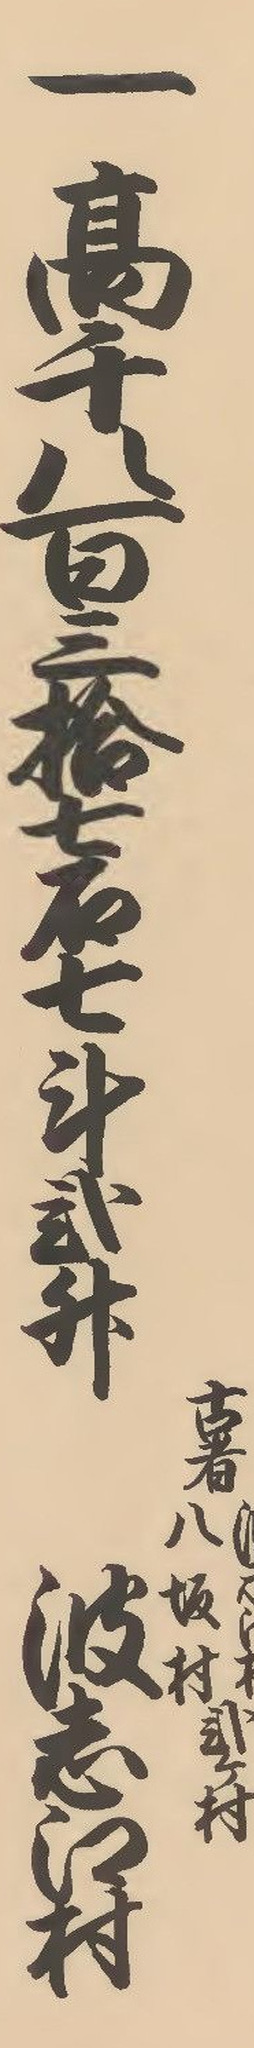一髙千八百三拾七石七斗弐升波志江村
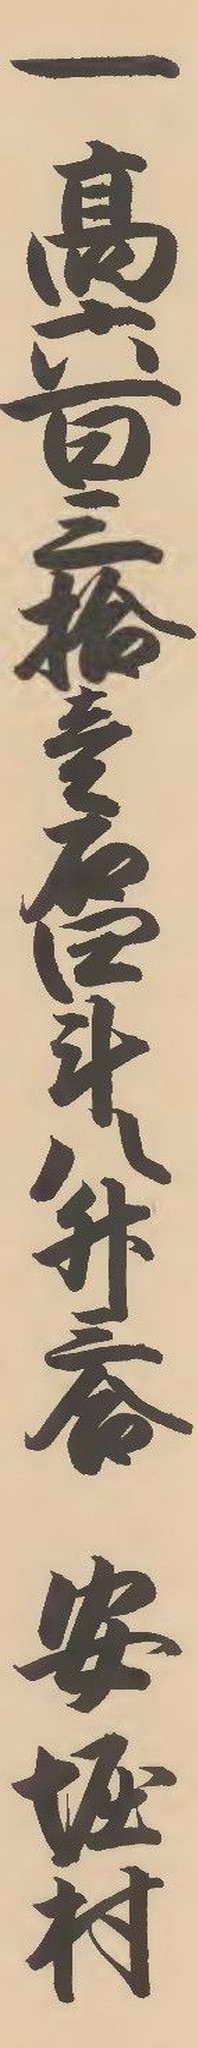一髙六百三拾壱石四斗八升三合安堀村
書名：上野国郷帳
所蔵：国立公文書館 National Archives of Japan
